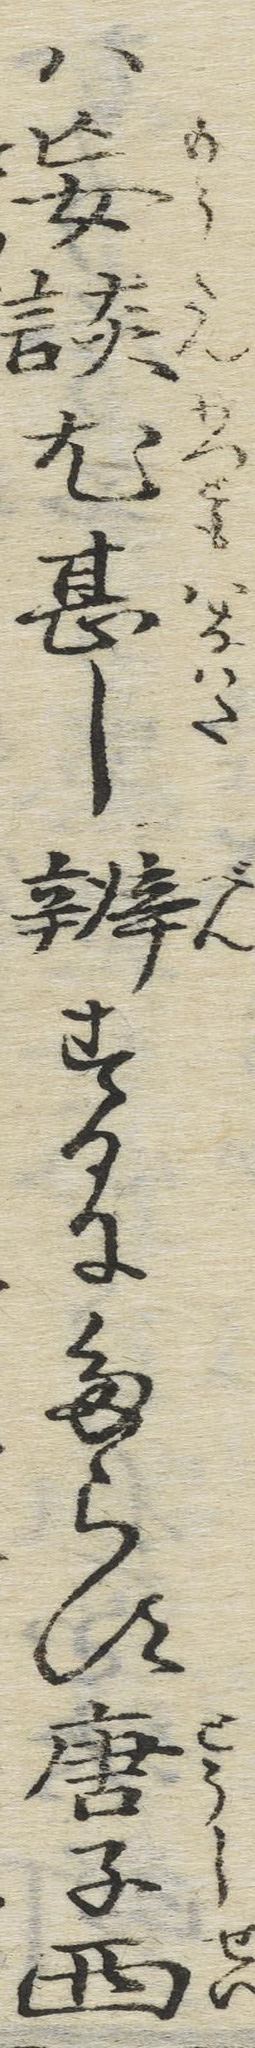は妄談尤甚し弁するにたらす唐子西
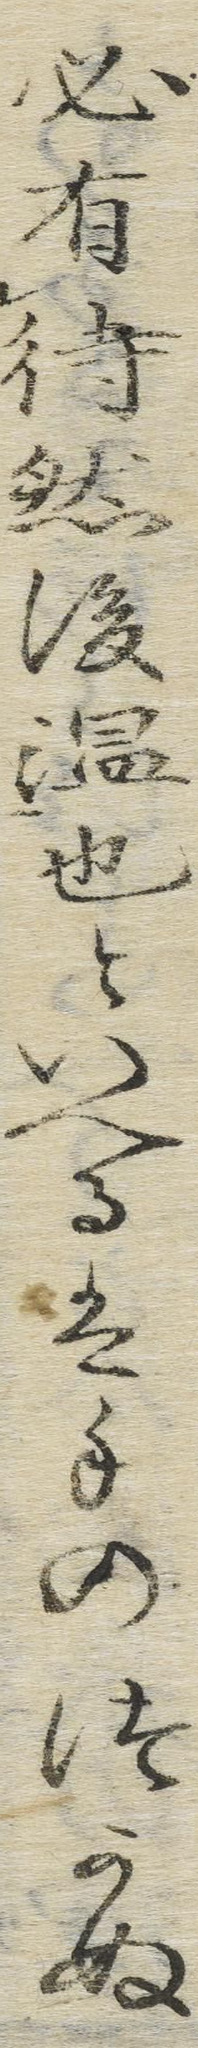必有待然後温也といへるは手のつかぬ
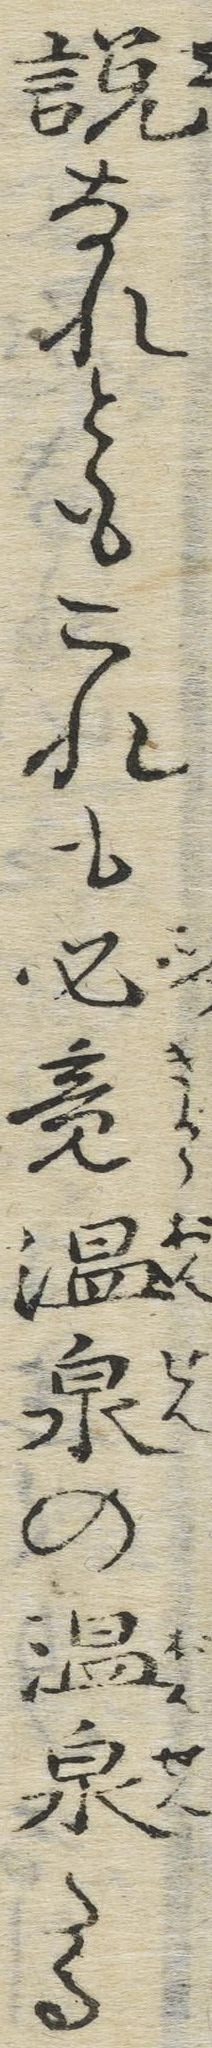説なれともこれも必竟温泉の温泉たる
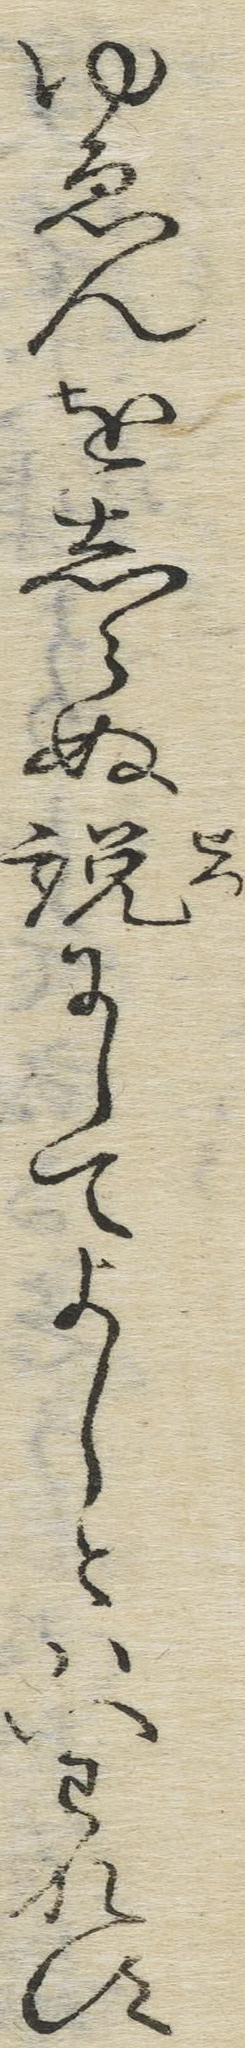ゆゑんをしらぬ説にしてよしとはいわれす
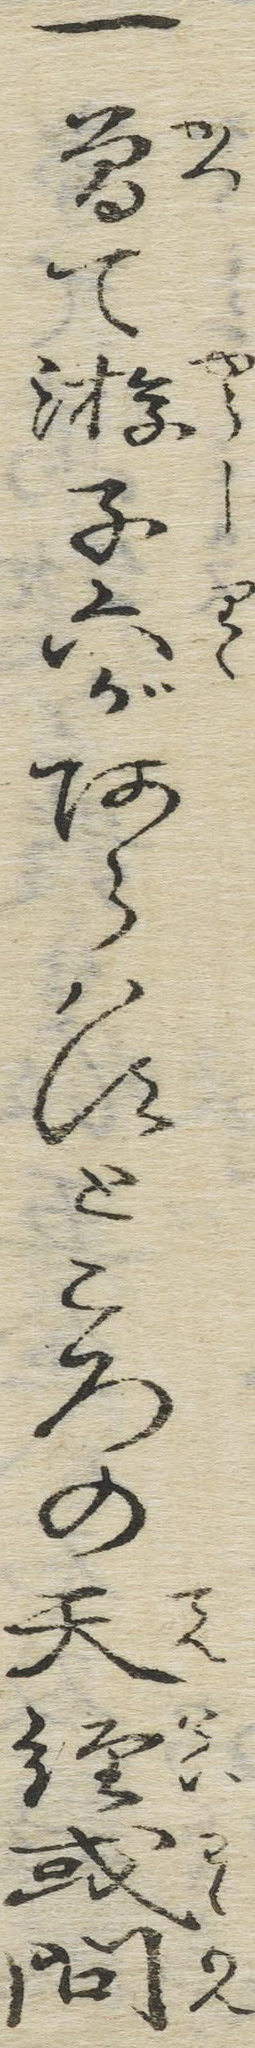一曽て游子六があらはすところの天経或問
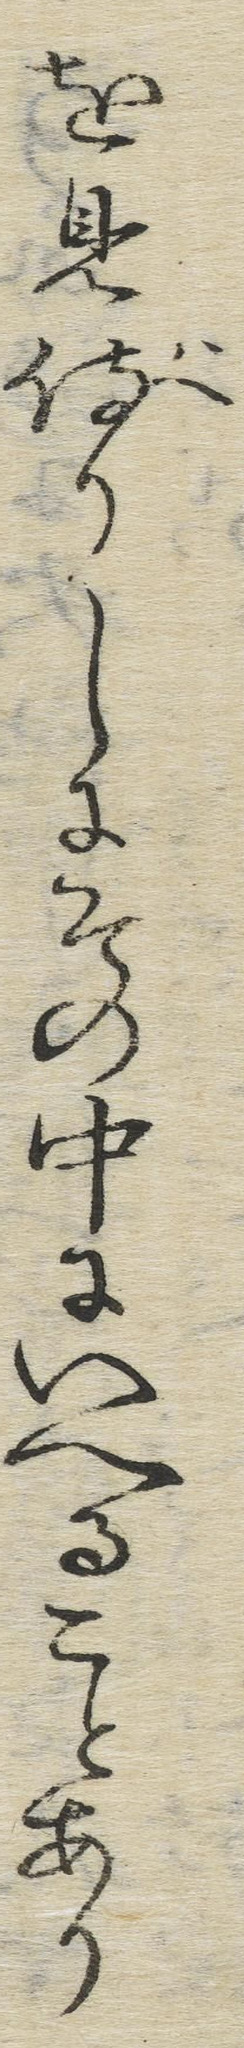を見侍りしにその中にいへることあり
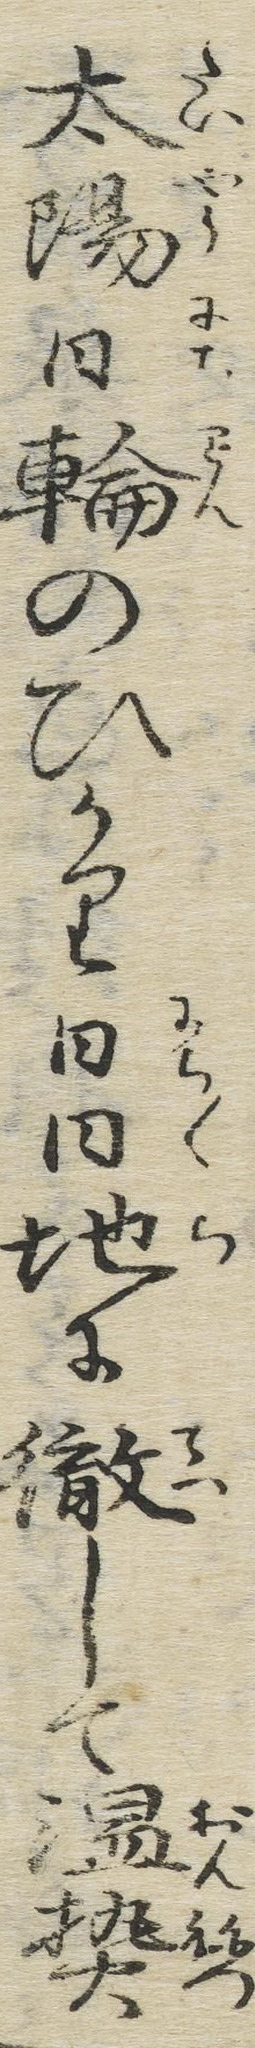太陽日輪のひかり日日地に徹して温熱
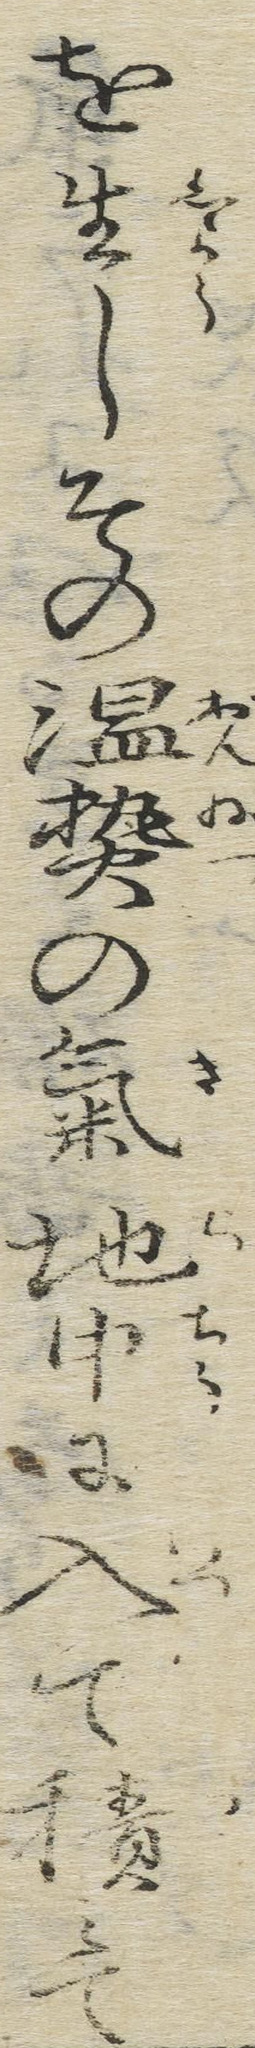を生しその温熱の気地中に入て積みて
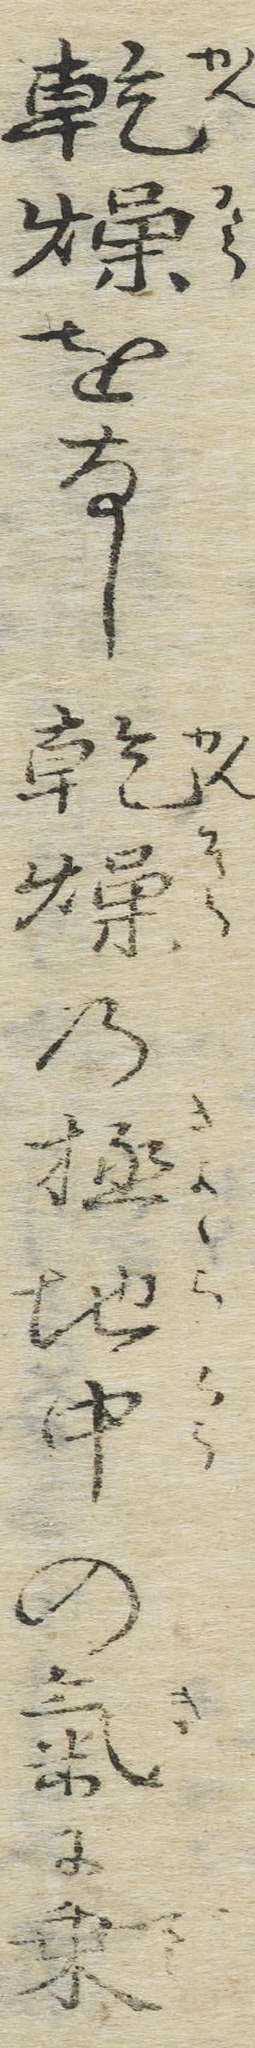乾燥をなし乾燥の極地中の気に乗
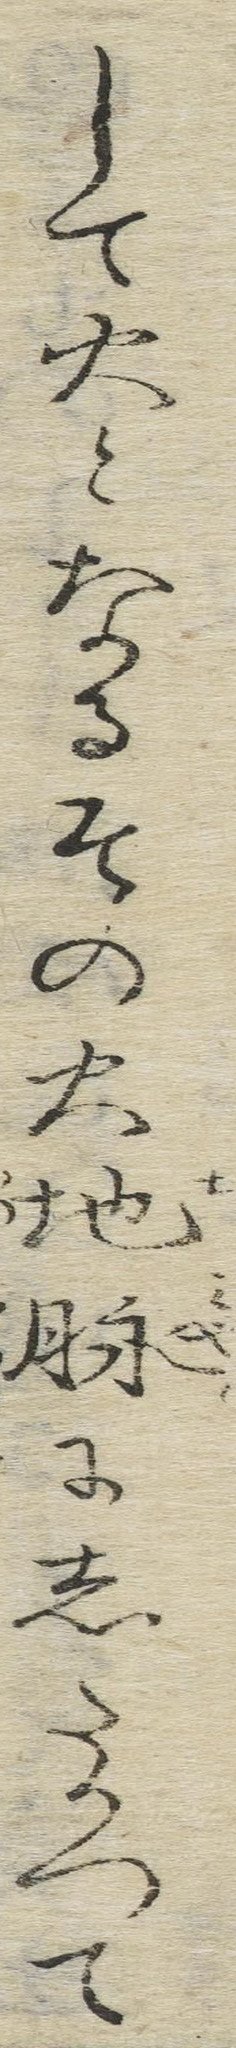して火となるその火地脈にしたかつて

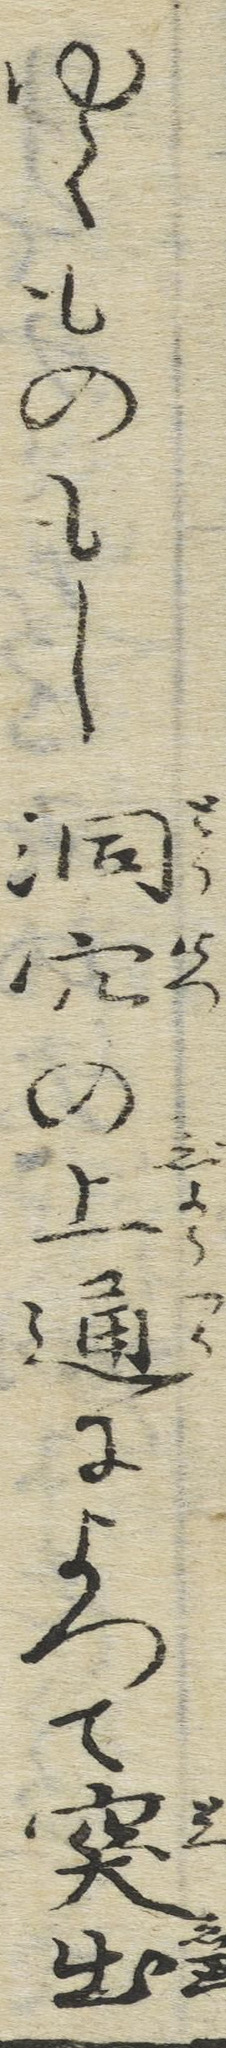ゆくものもし洞穴の上通によつて突出
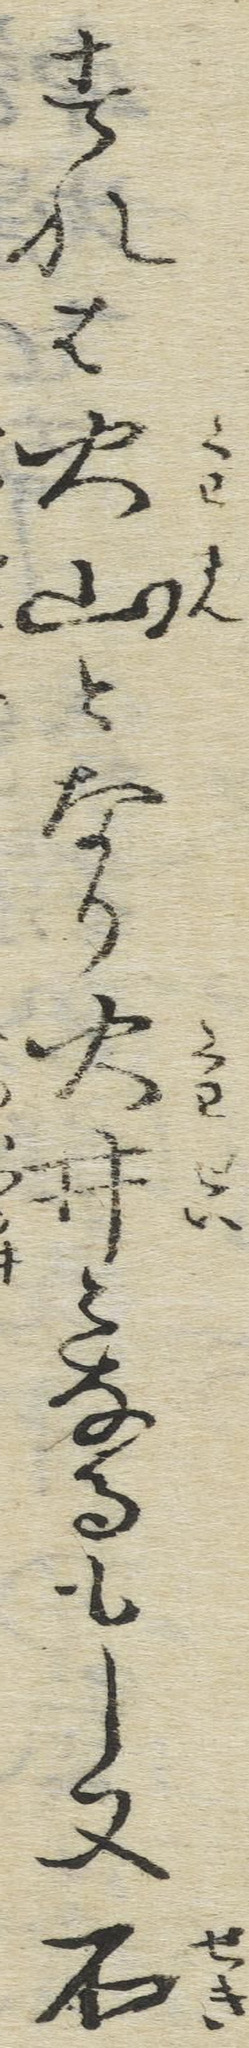すれは火山となり火井となるもし又石
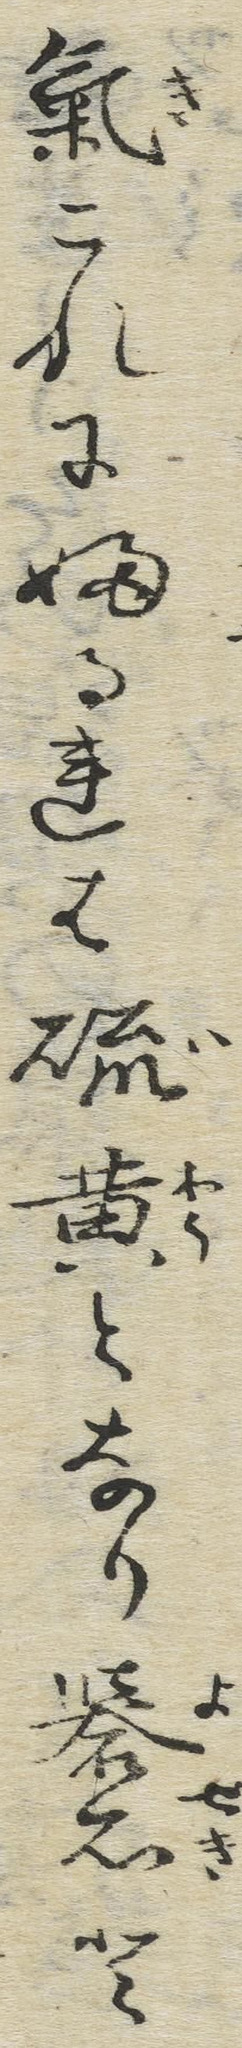気これにふるれは硫黄となり礜石と
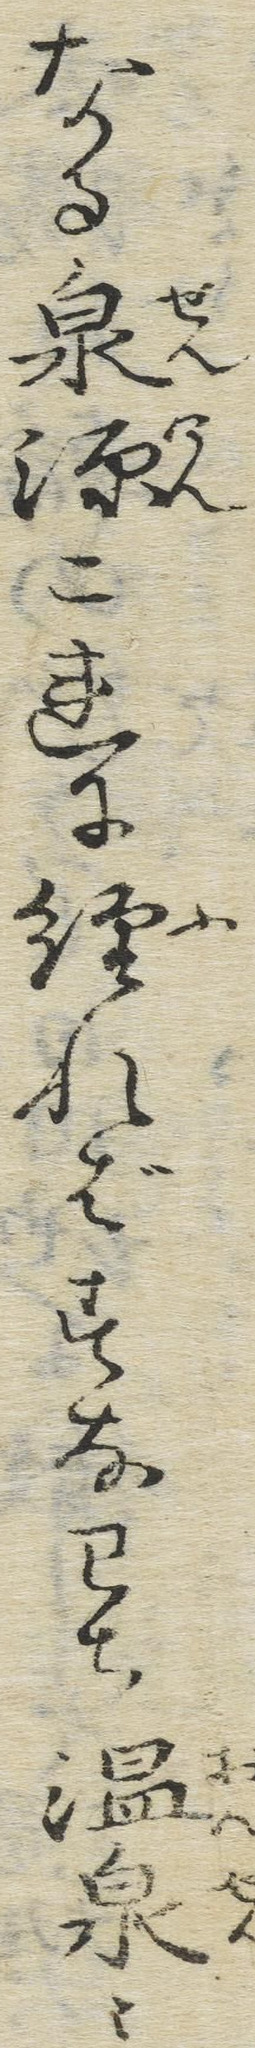なる泉源これに経ればすなわち温泉と
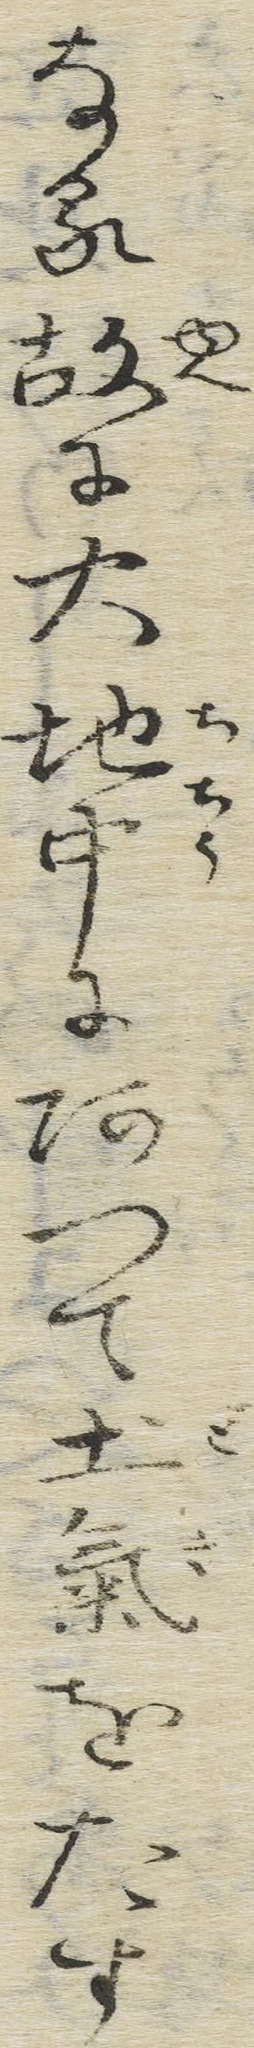なる故に火地中にあつて土気をたす
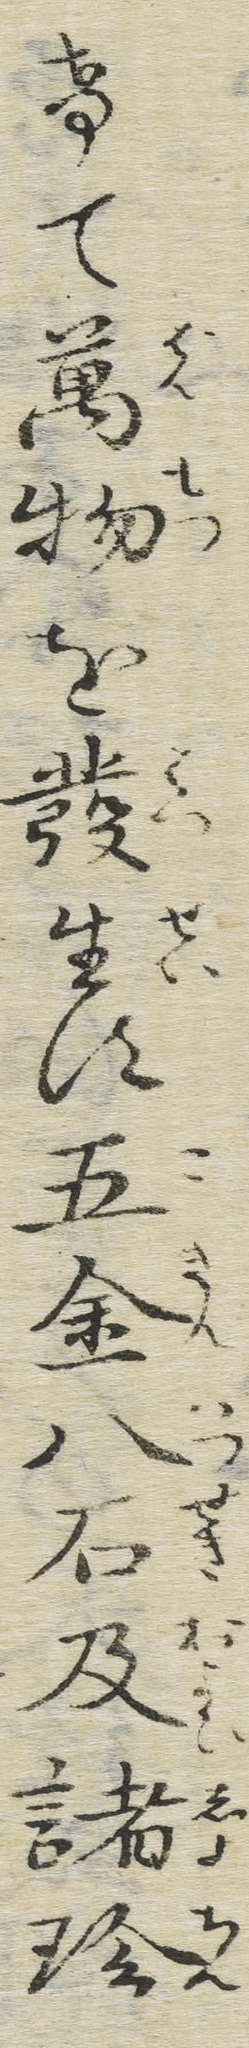けて万物を発生す五金八石及諸珍
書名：温泉考
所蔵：東京大学地震研究所図書室 Earthquake Research Institute Library, The University of Tokyo, JAPAN
